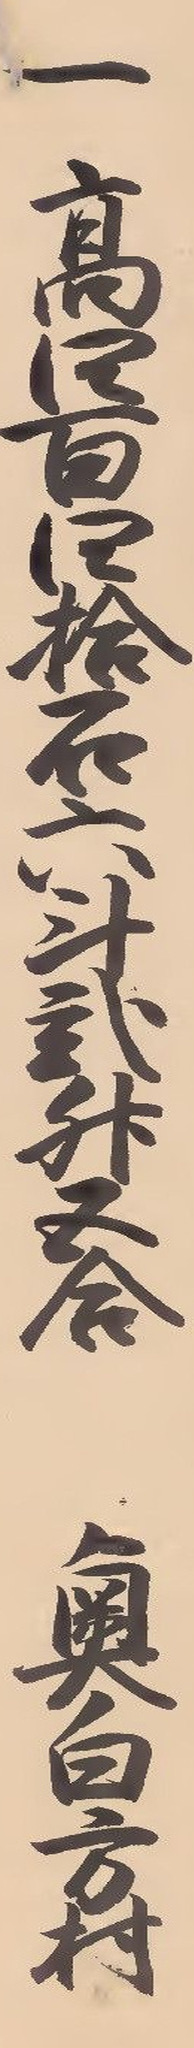一高四百四拾石六斗弐升五合奥白方村
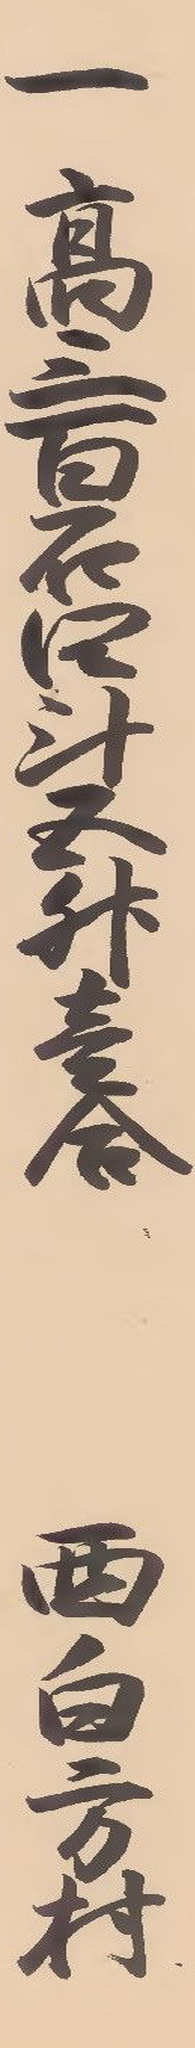一高三百石四斗五升壱合西白方村
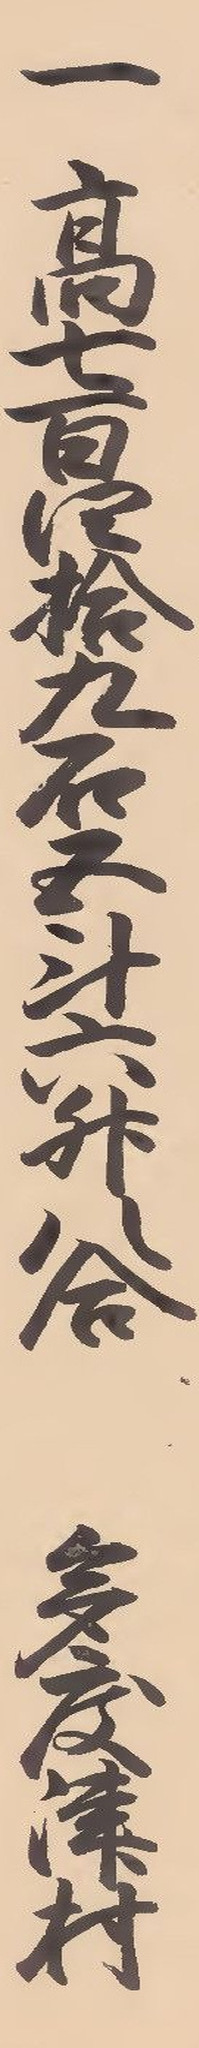一高七百四拾九石五斗六升八合多度津村
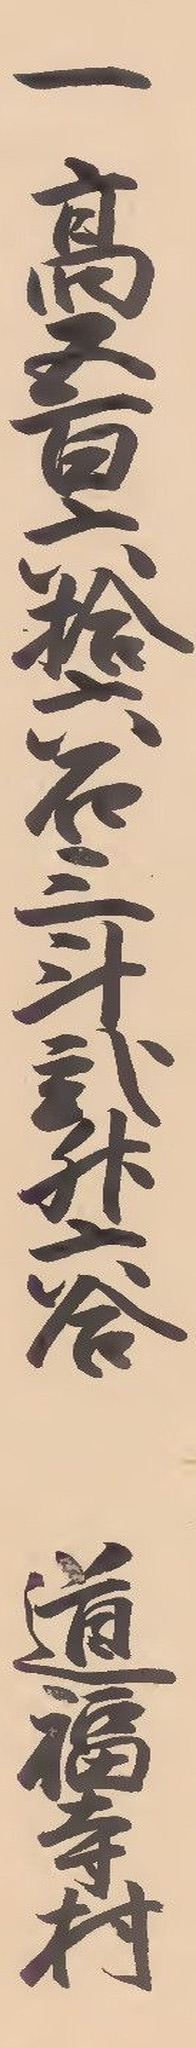一高五百六拾六石三斗弐升六合道福寺村

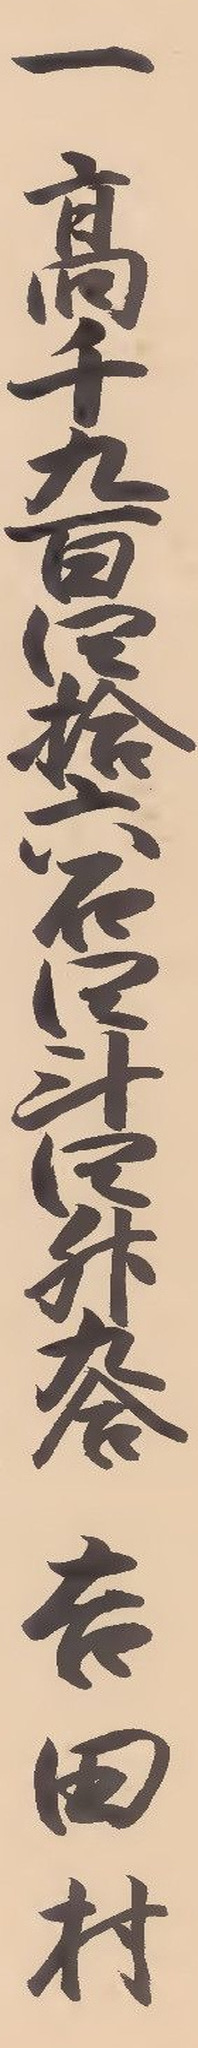一高千九百四拾六石四斗四升九合吉田村
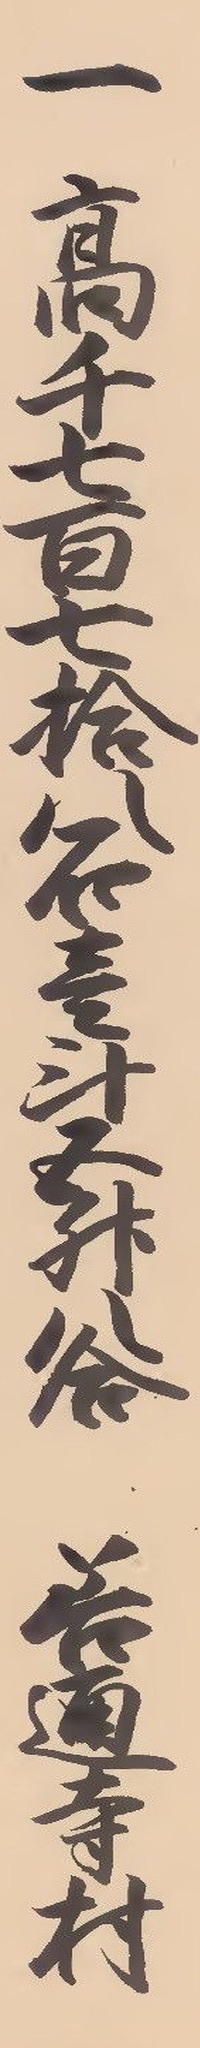一高千七百七拾八石壱斗五升八合善通寺村
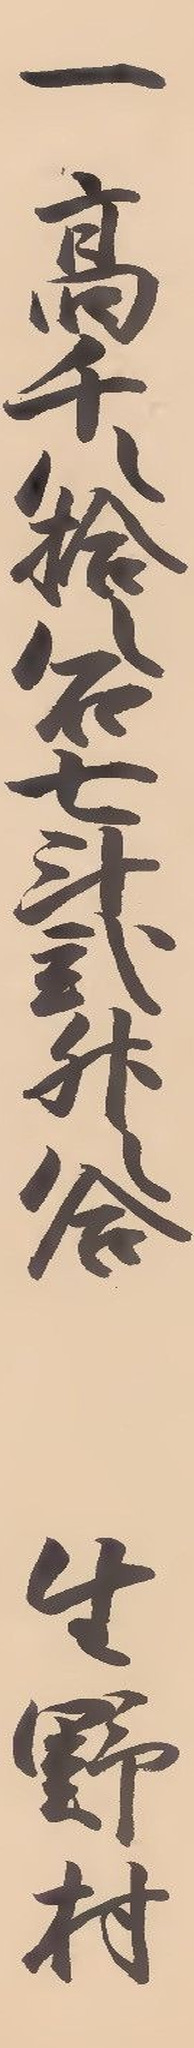一高千八拾八石七斗弐升八合生野村
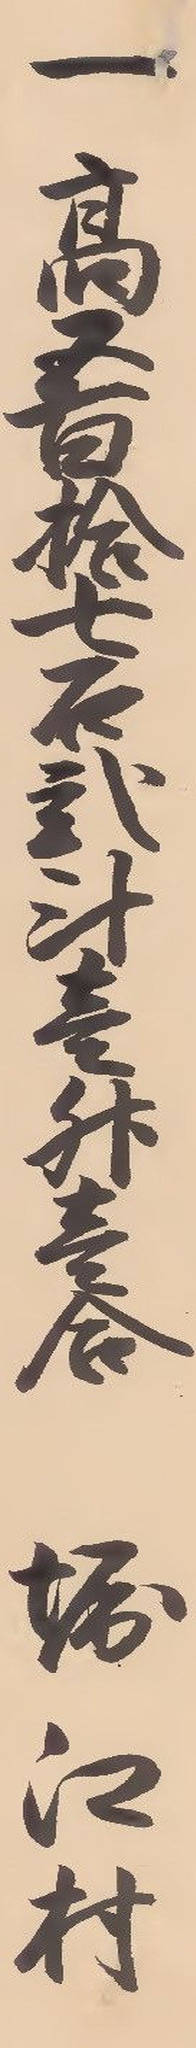一高五百拾七石弐斗壱升壱合堀江村
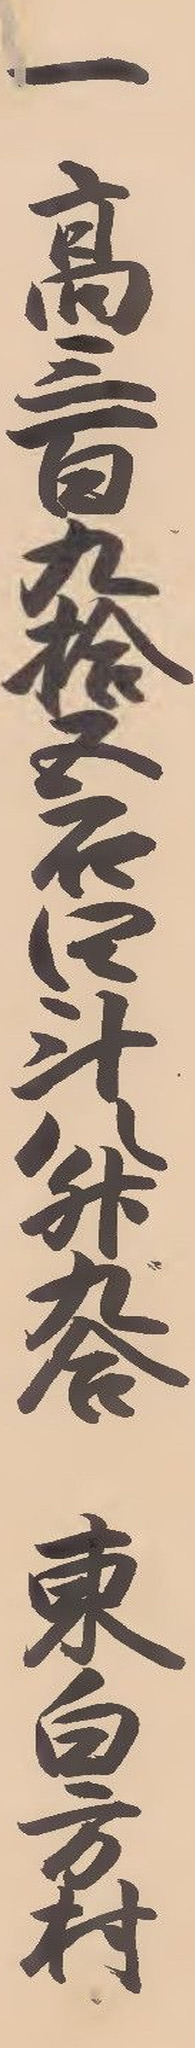一高三百九拾五石四斗八升九合東白方村
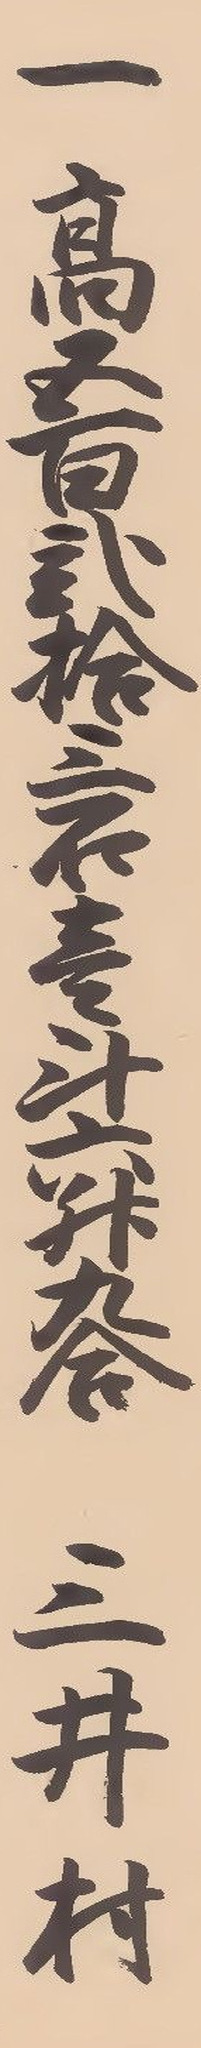一高五百弐拾三石壱斗六升九合三井村
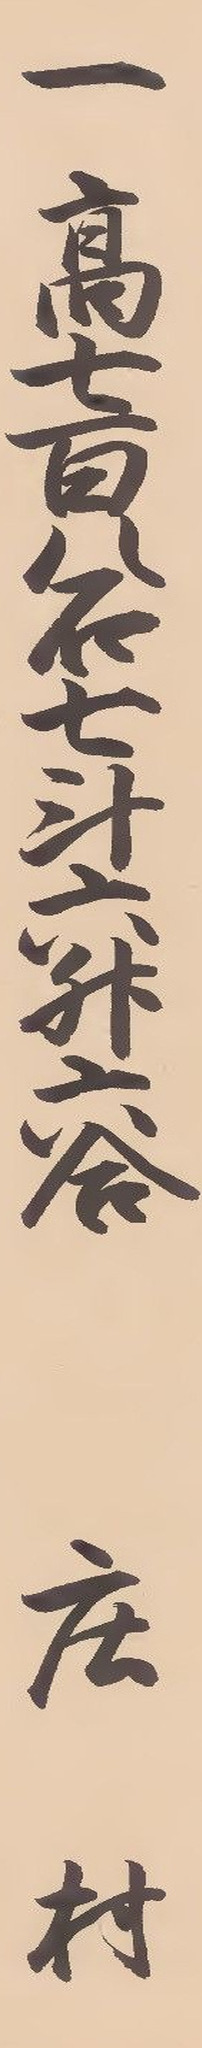一高七百八石七斗六升六合庄村
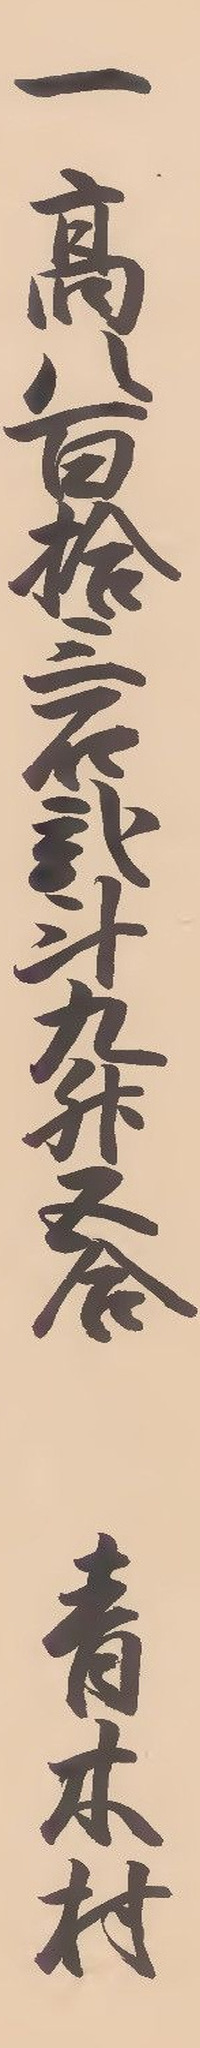一高八百拾三石弐斗九升五合青木村

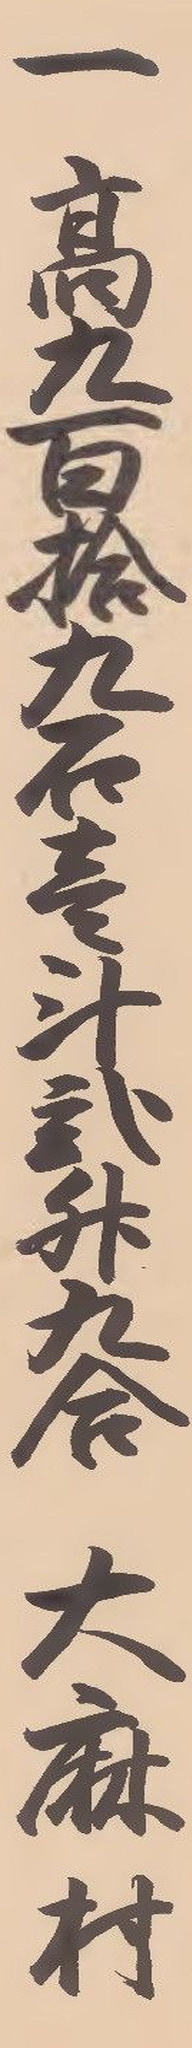一高九百拾九石壱斗弐升九合大麻村
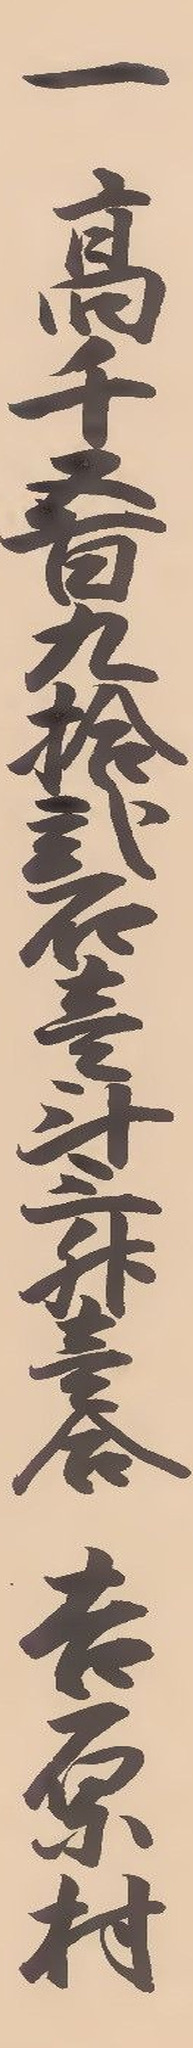一高千五百九拾弐石壱斗三升壱合吉原村
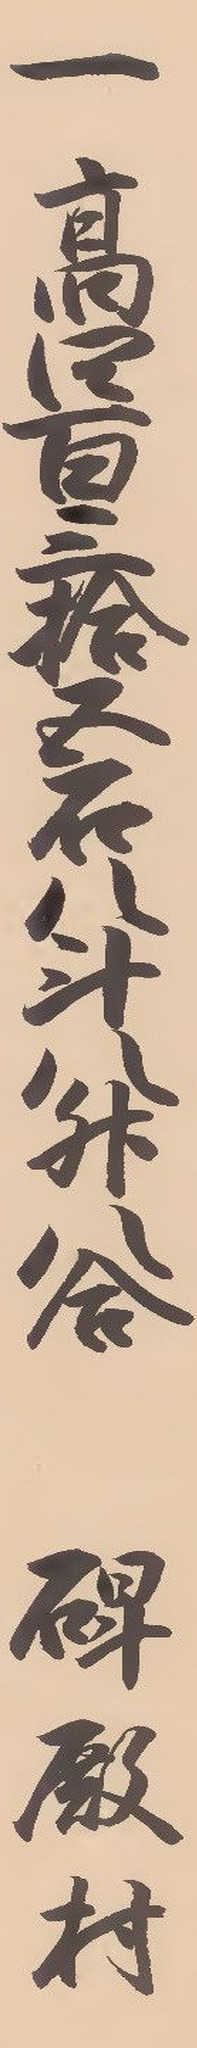一高四百三拾五石八斗八升八合碑殿村
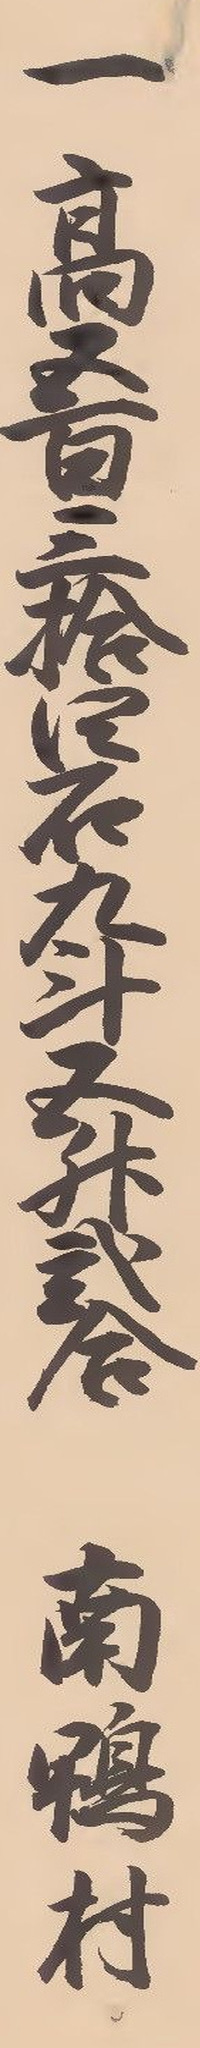一高五百三拾四石九斗五升弐合南鴨村
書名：讃岐国郷帳
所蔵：国立公文書館 National Archives of Japan
